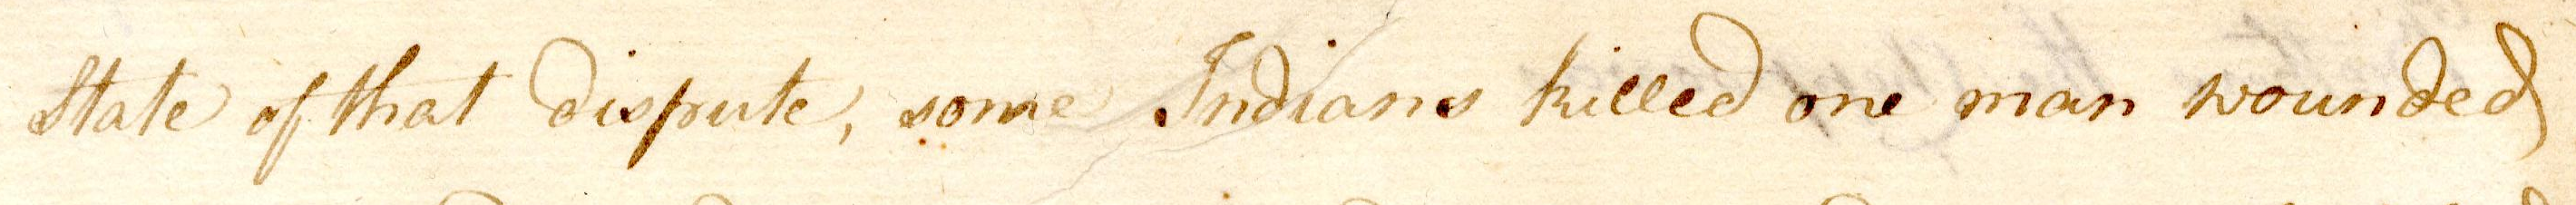State of that dispute, some Indians killed one man wounded
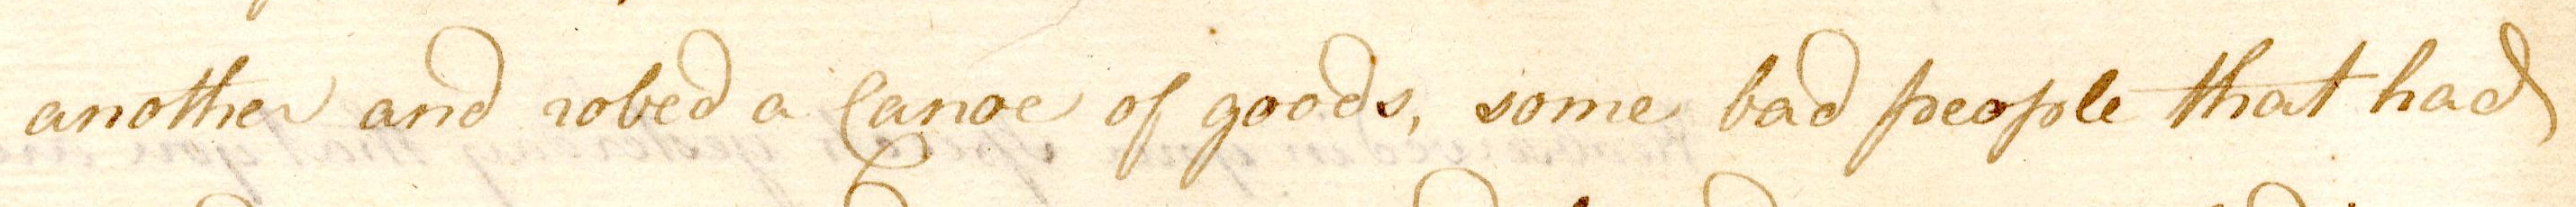another and robed a Canoe of goods, some bad people that had
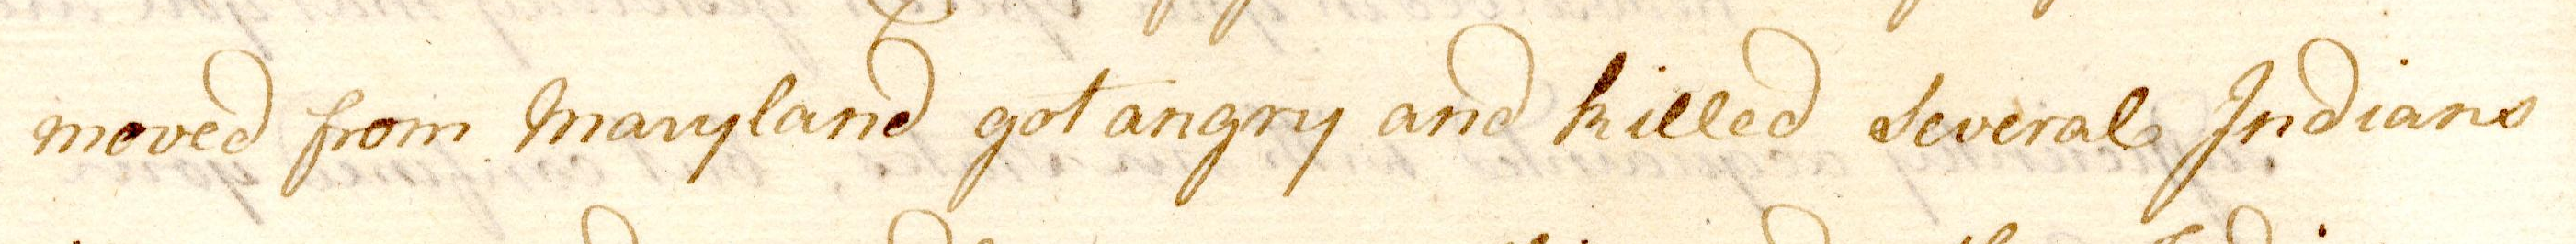moved from Maryland got angry and killed several Indians
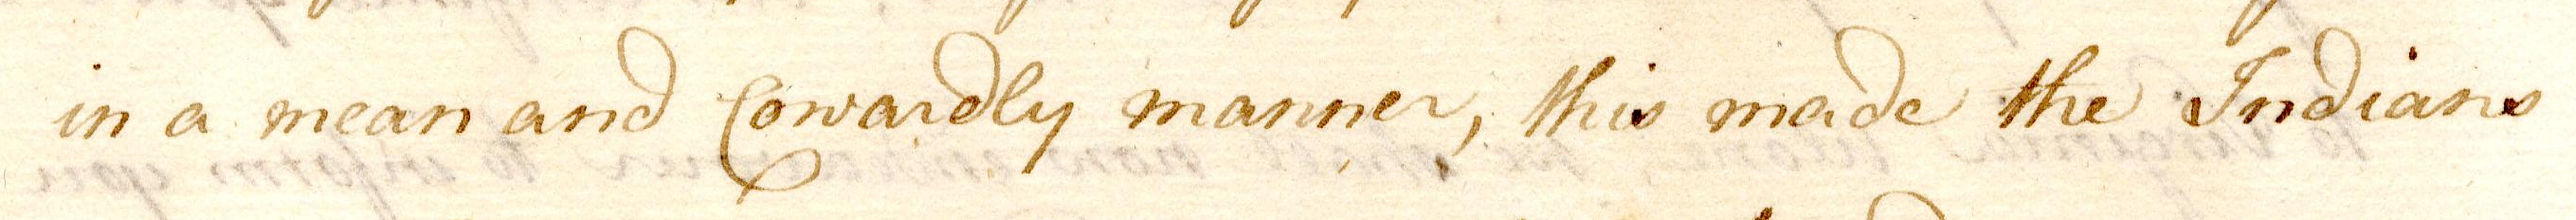in a mean and Cowardly manner, this made the Indians
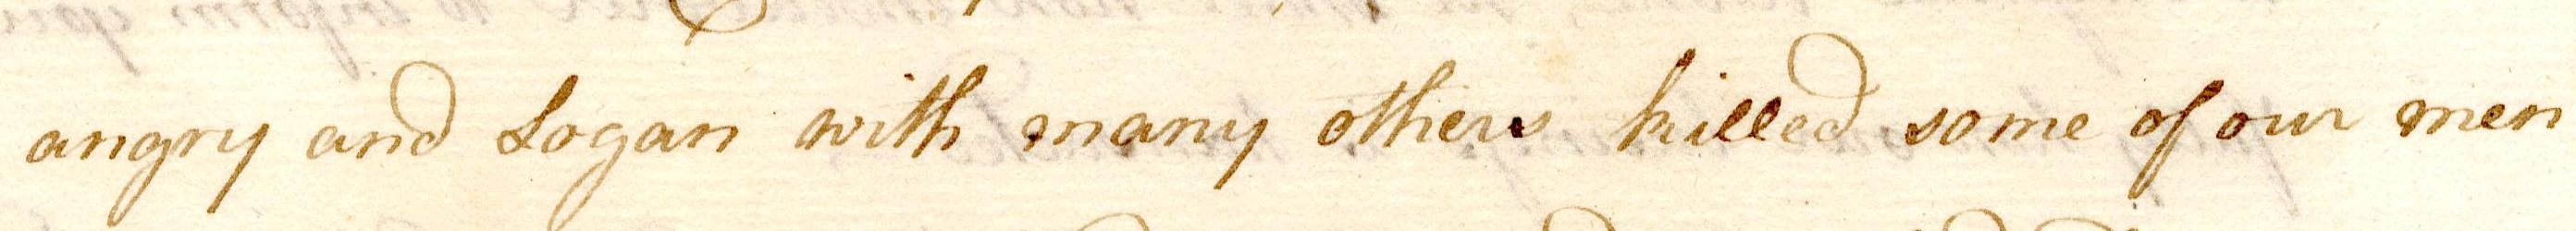angry and Logan with many others killed some of our men
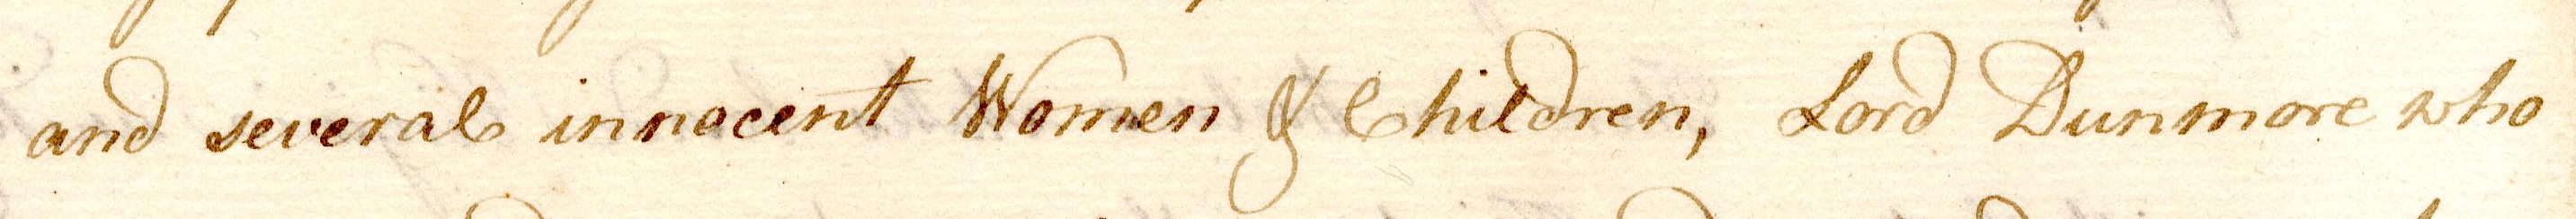and several innocent Women & Children, Lord Dunmore who
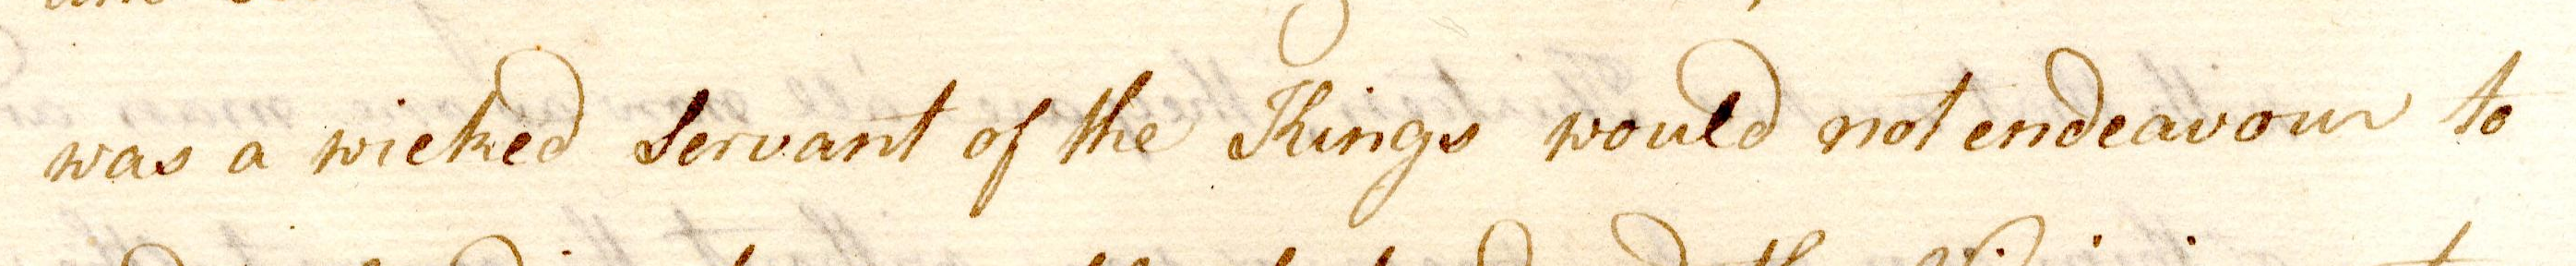was a wicked servant of the Kings would not endeavour to
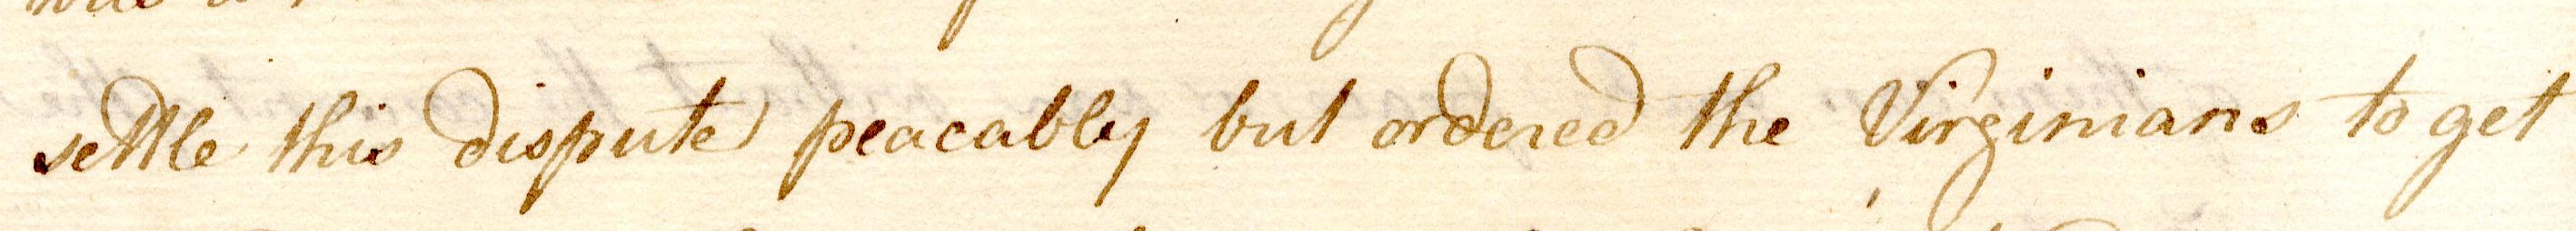settle this dispute peacably but ordered the Virginians to get
